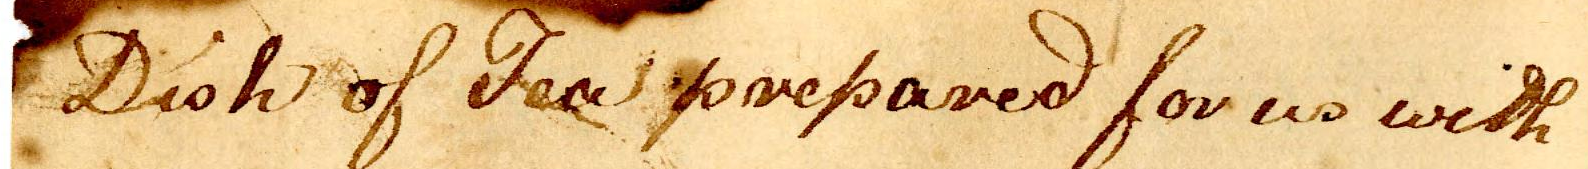Dish of Tea prepared for us with
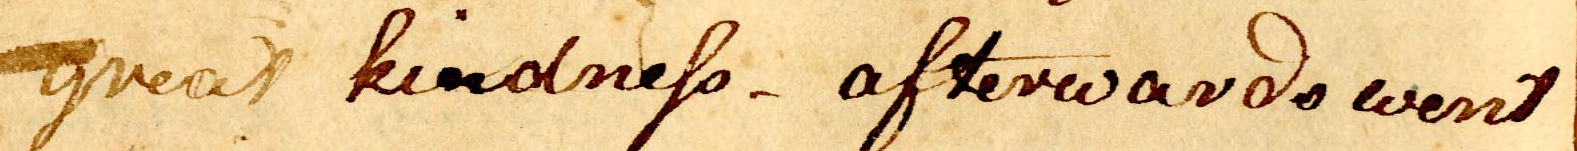great kindness- afterwards went
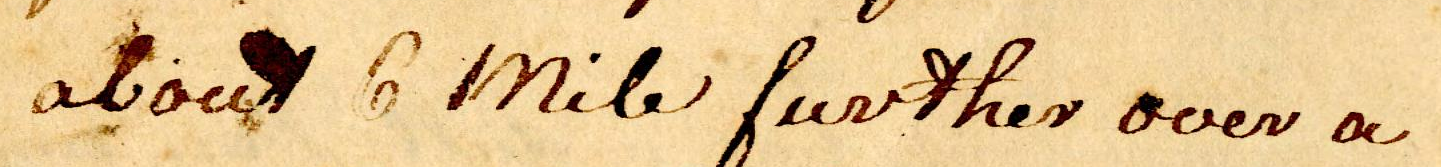about 6 Mile further over a
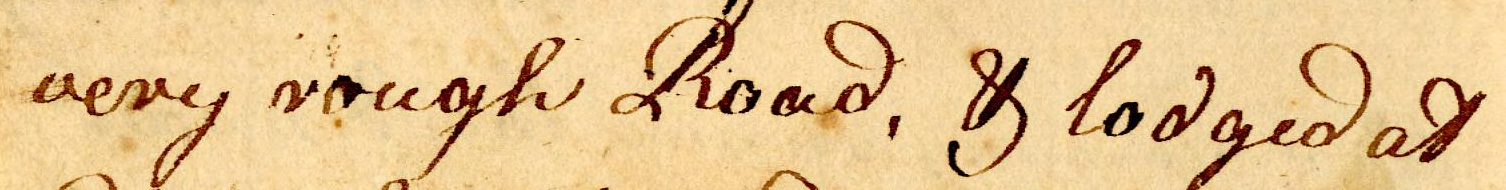very rough Road, & lodged at
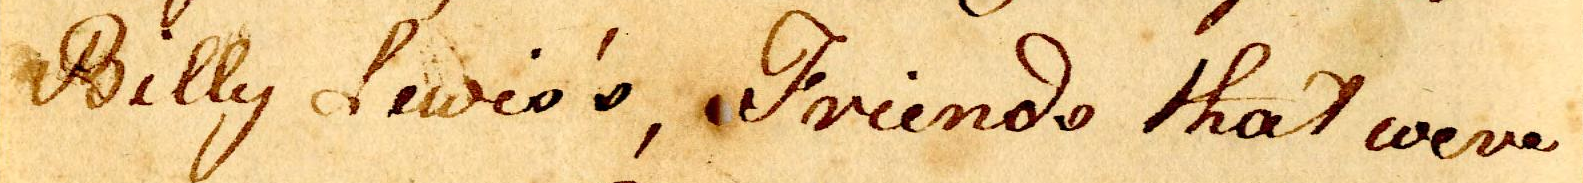Billy Lewis's, Friends that were
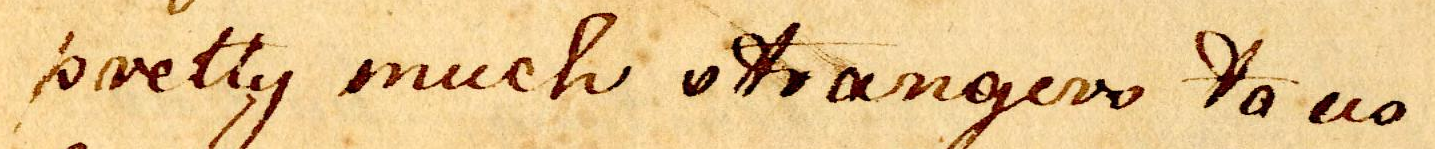pretty much strangers to us
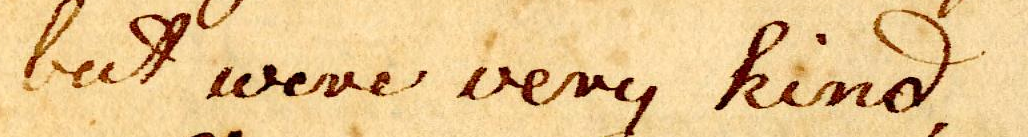but were very kind,
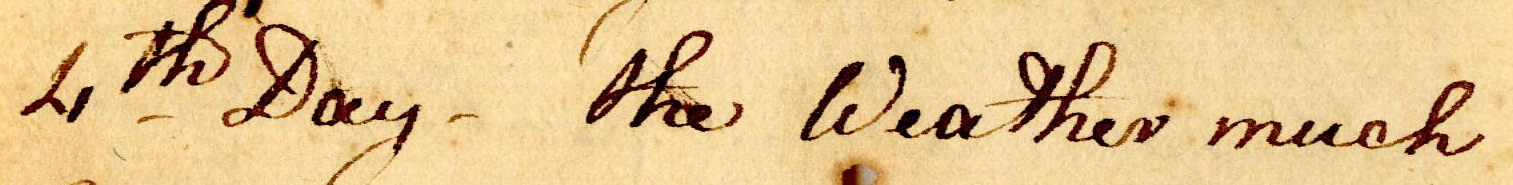4^th Day- the Weather much
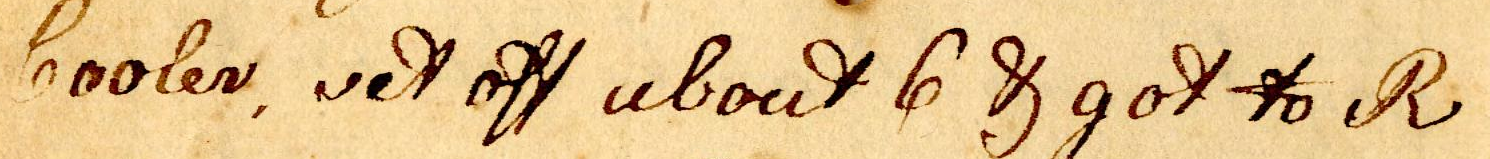Cooler, set off about 6 & got to R
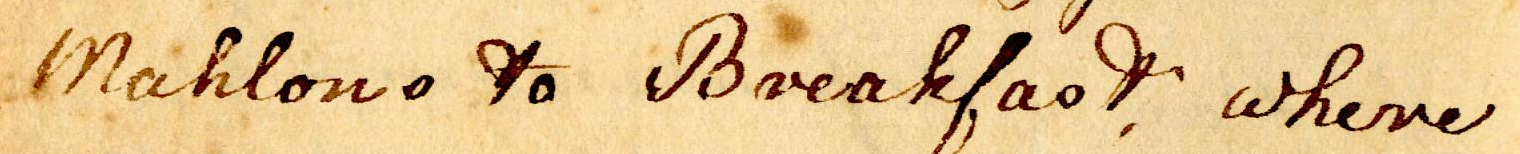Mahlons to Breakfast, where
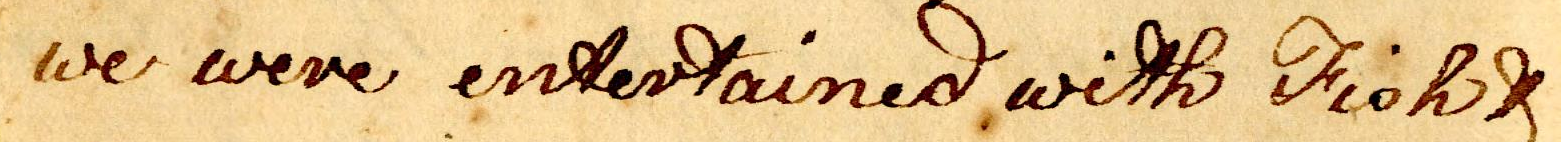we were entertained with Fish &
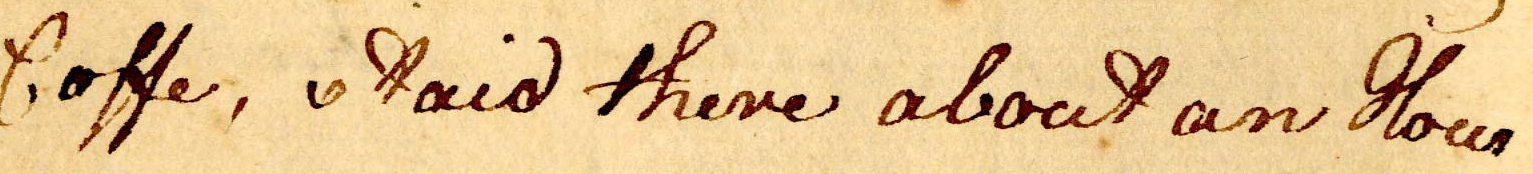Coffe, staid there about an Hour
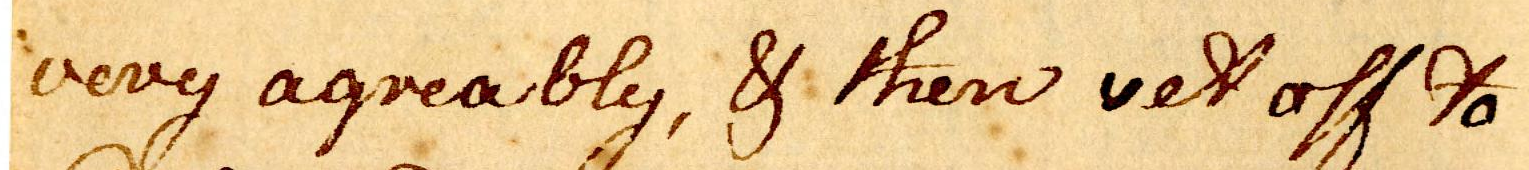very agreably, & then set off to
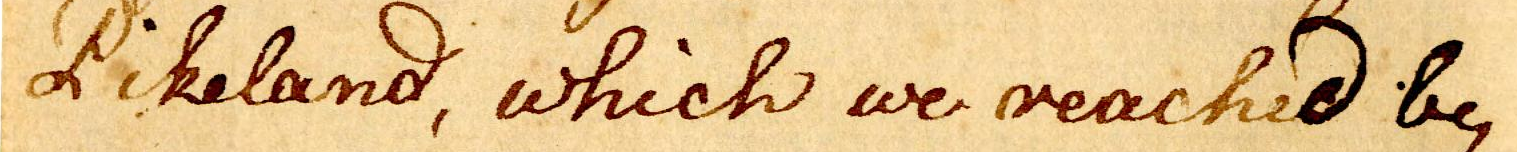Pikeland, which we reached by
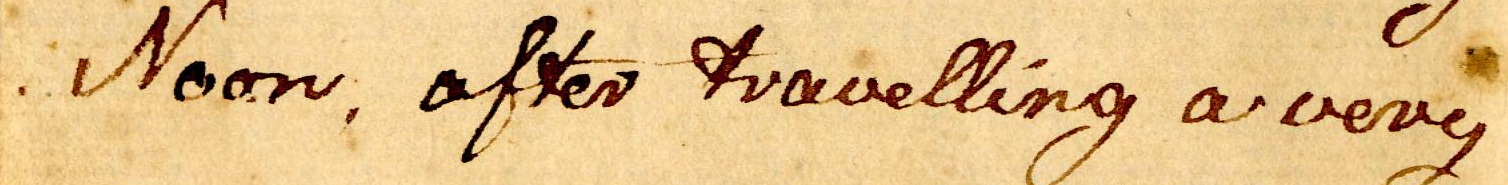Noon, after travelling a very
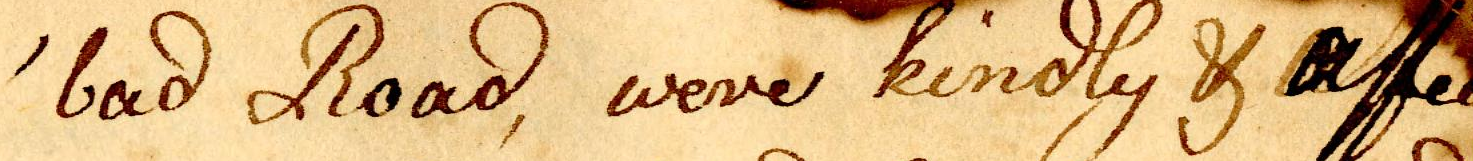bad Road, were kindly & affec
